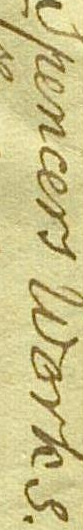Spencers Works.
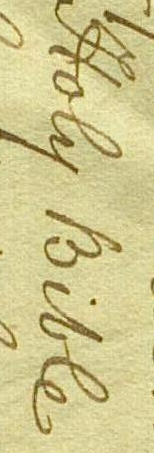Holy Bible
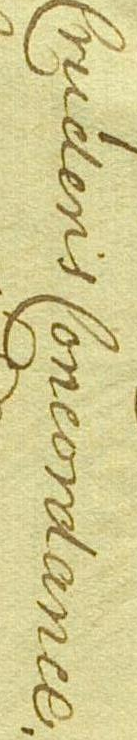Cruden's Concordance.
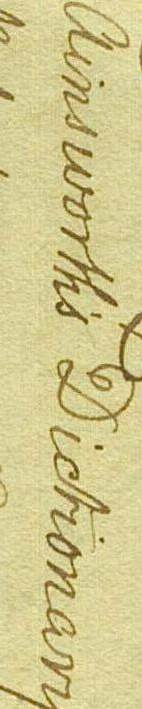Ainsworth's Dictionary
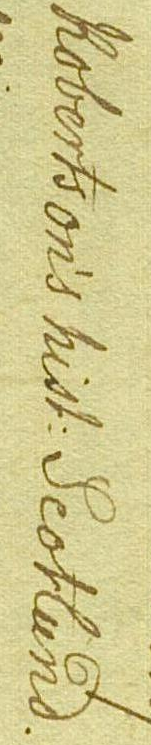Robertson's hist: Scotland.
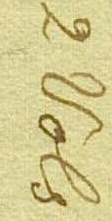2 Vols
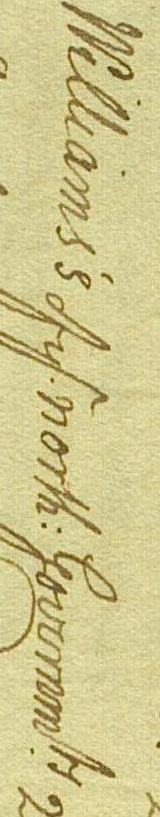Williams's of y^e. north: Governm^ts.
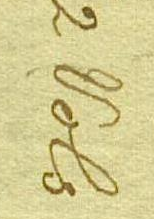2 Vols
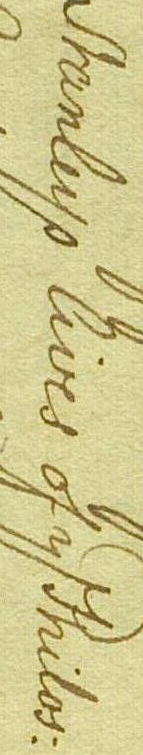Stanleys lives of y^e Philos:
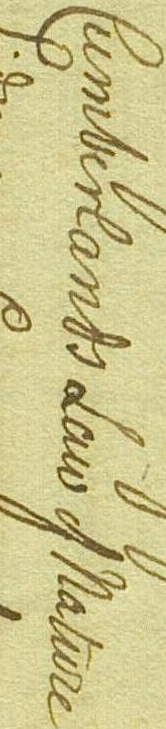Cumberlands Law of Nature
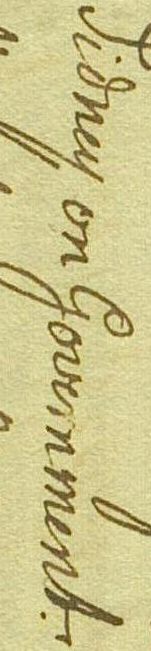Sidney on Government.
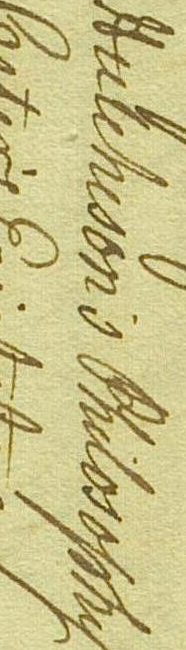Hutcheson's Philosophy
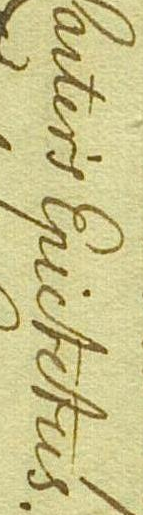Carter's Epictetus.
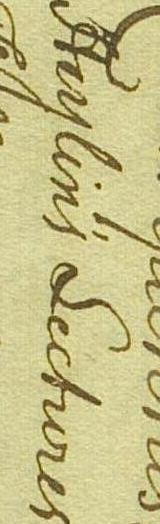Heylin's Lectures
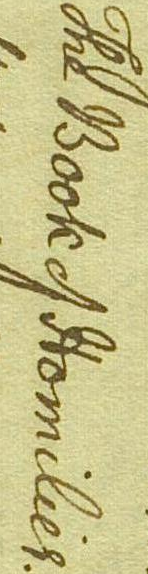The Book of Homilies.
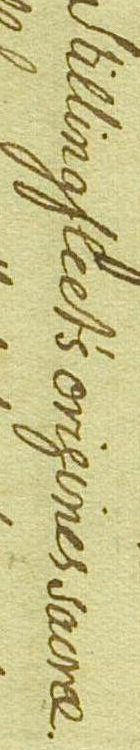Stillingfleet's origines sacree.
